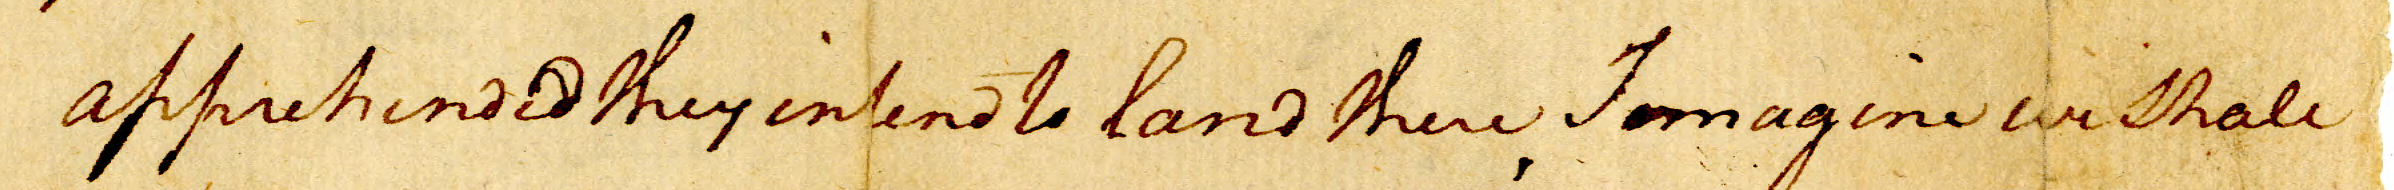apprehended they intend to land there, I imagine we shall
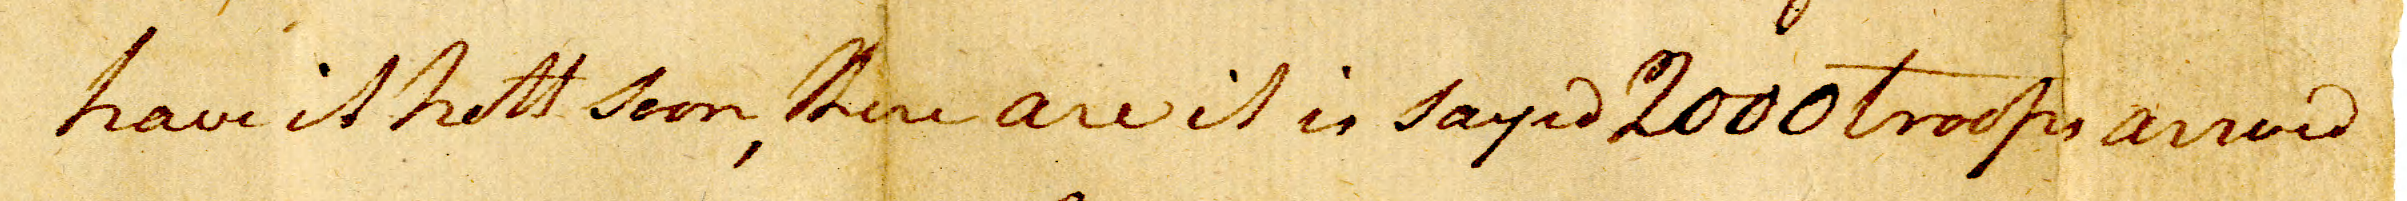have it hott soon, there are it is sayed 2000 troops arrived
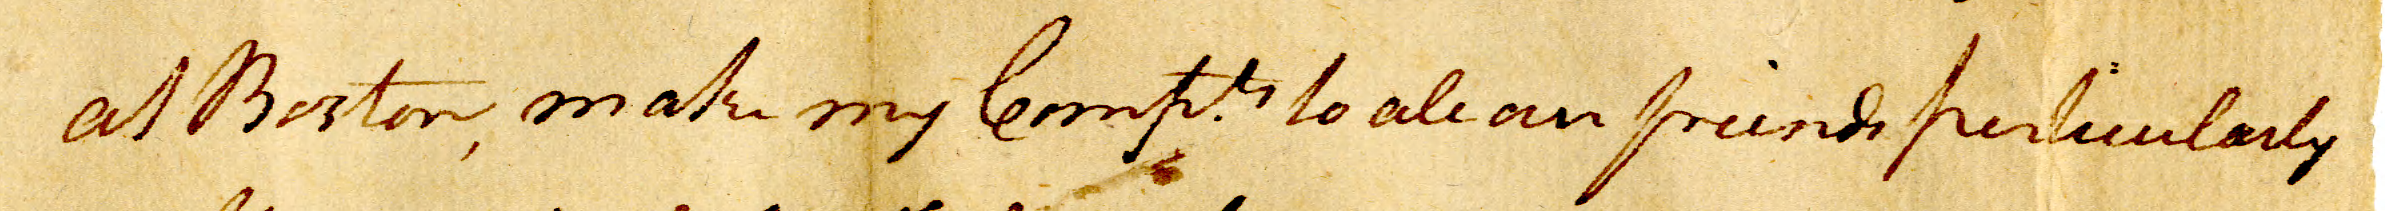at Boston, make my Compl^ts. to all our friends perticularly
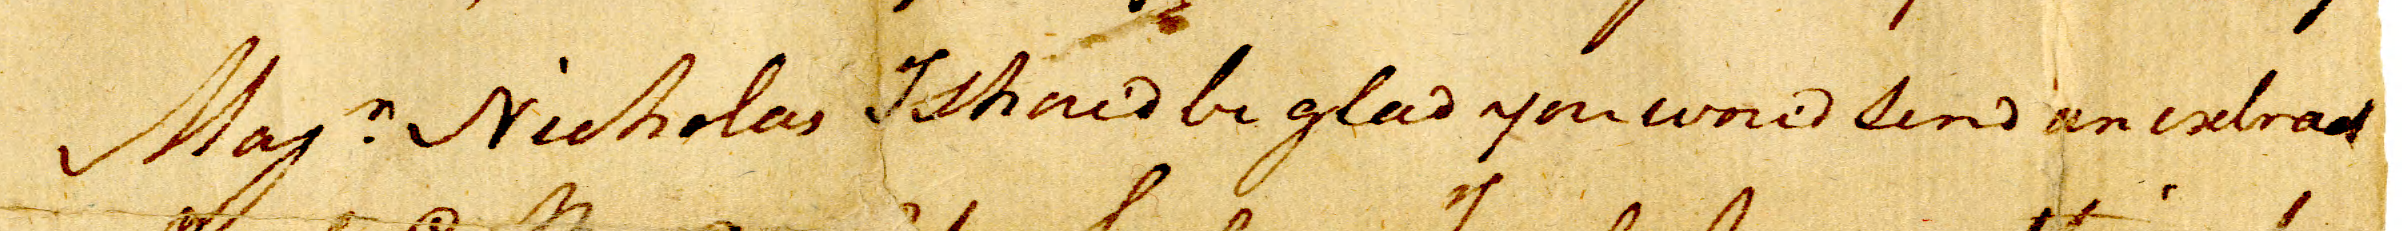Maj^r. Nicholas I should be glad you wou'd send an extract
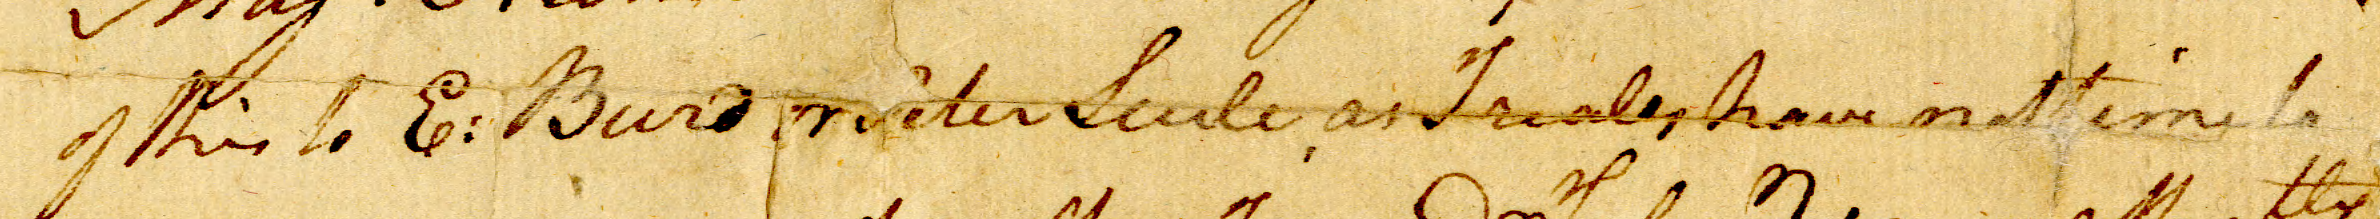of this to E: Burd mister Seule, as I really have not time to
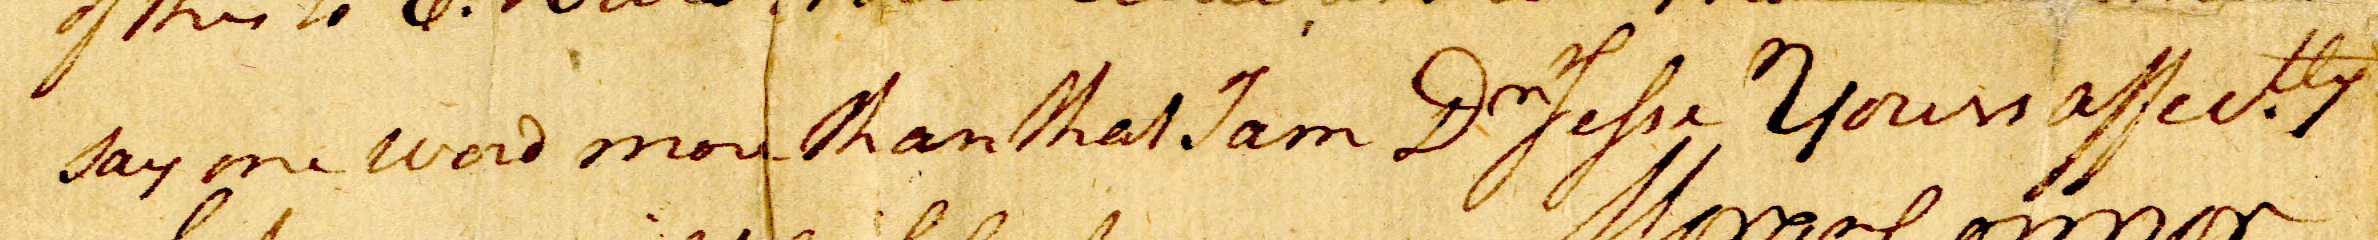say one word more than that I am D^r Jesse Yours affect^ly.
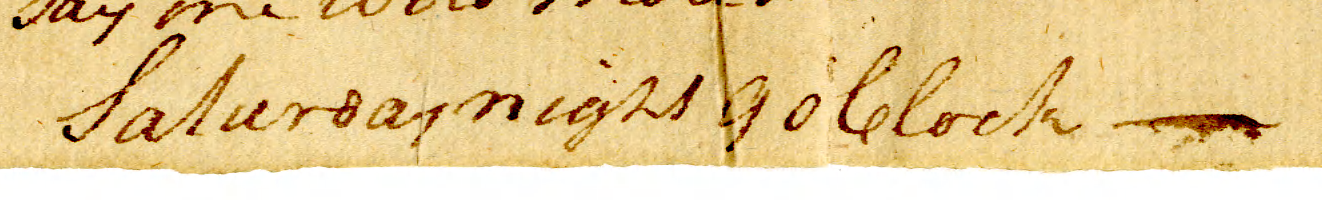Saturday night 9 o'Clock-
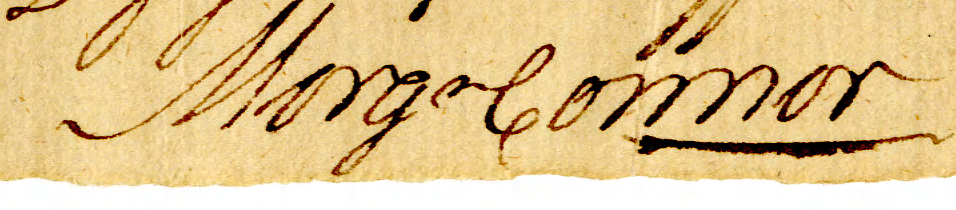Morg^n Connor
